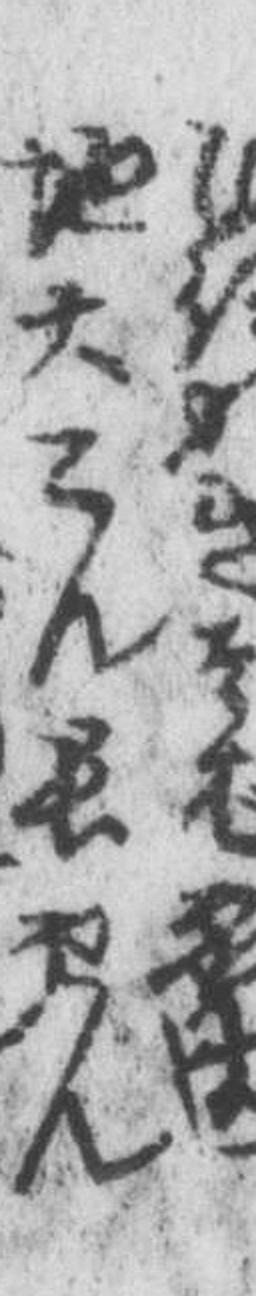大こん長せん
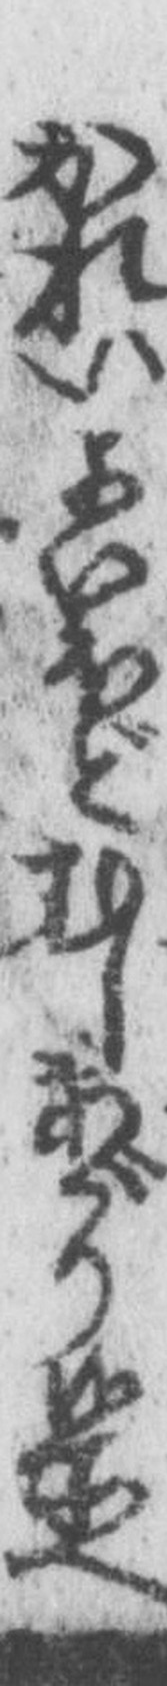かれいによいほどむしあがり
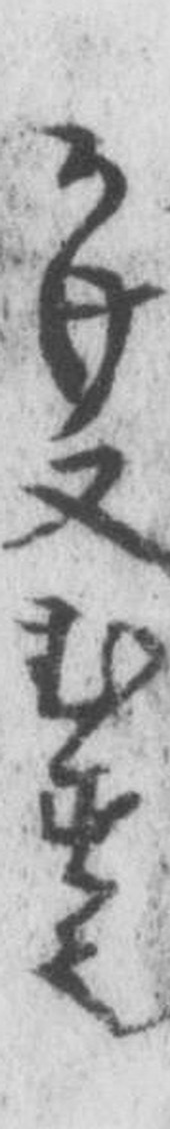かけ又むす也
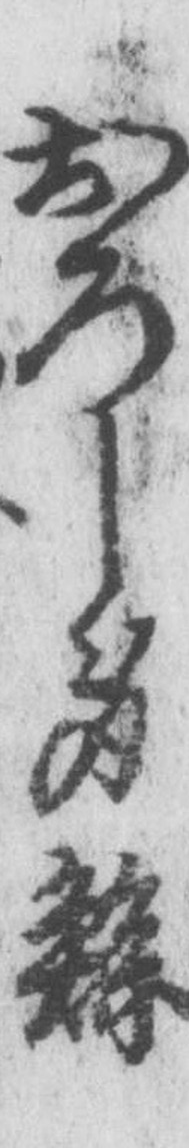おろし身鰈
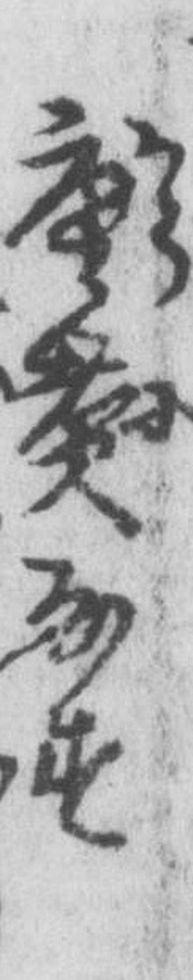唐煮なす
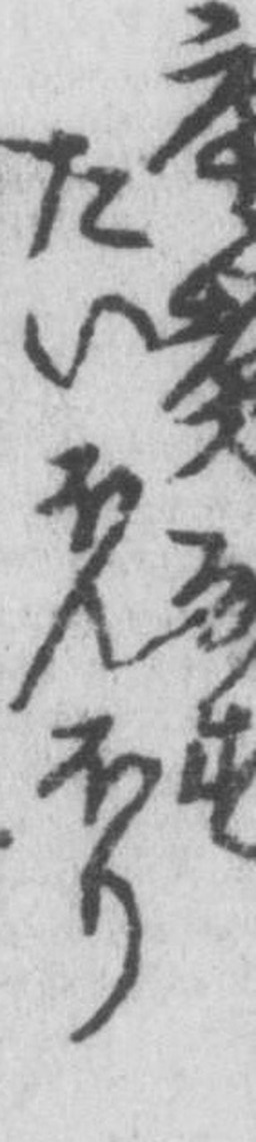たいほんほり
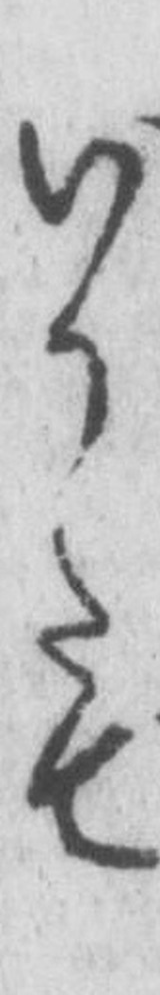いりたて
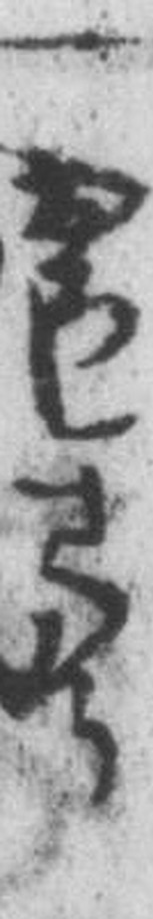おろし身鰈
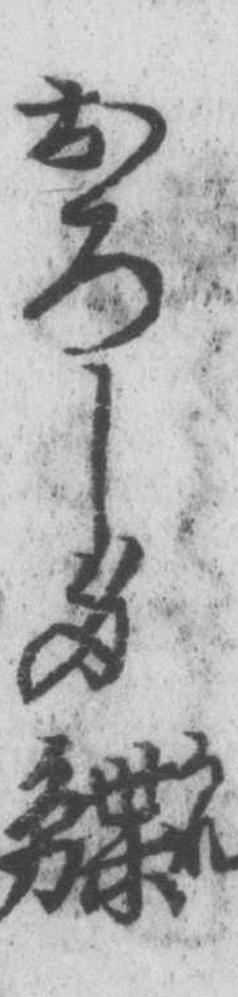おろし身鰈
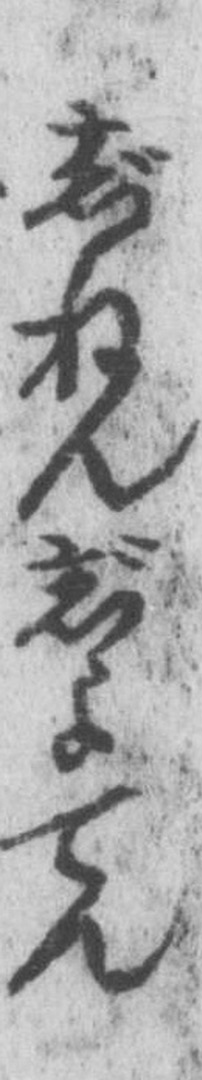しねんじよてん
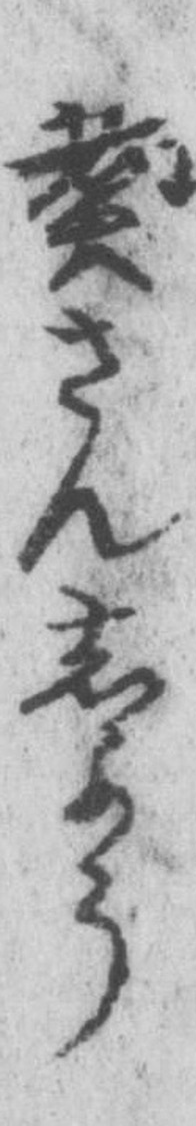煮さんしよう

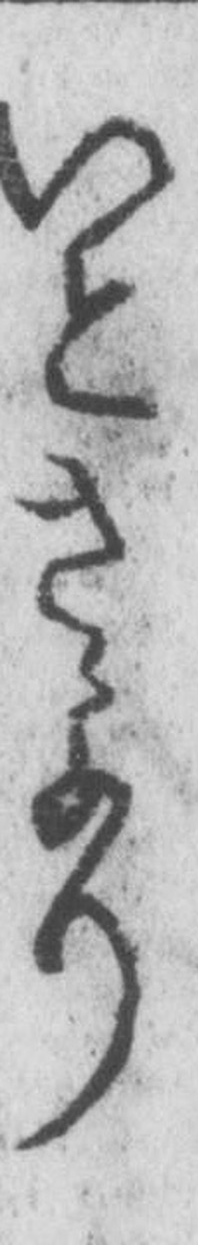いとさより
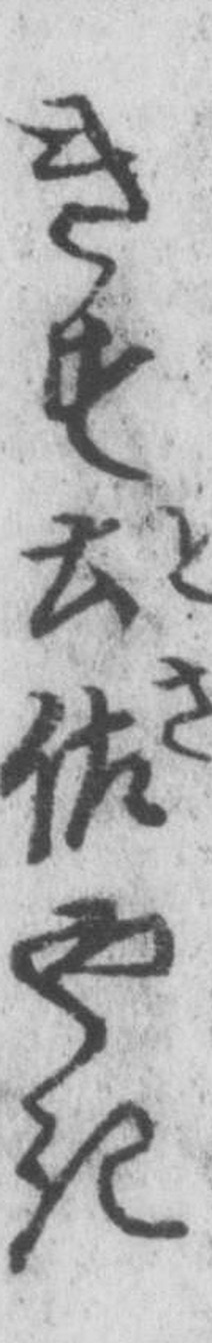きす土佐やき
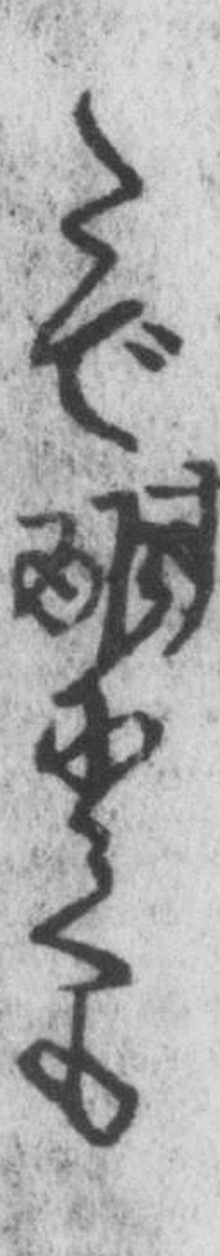たでミそにても
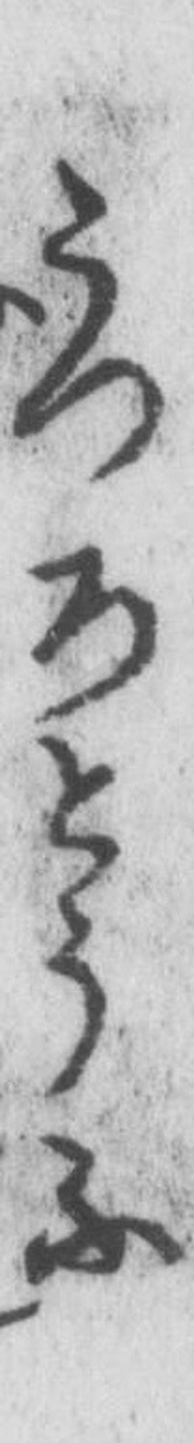うつとうふ
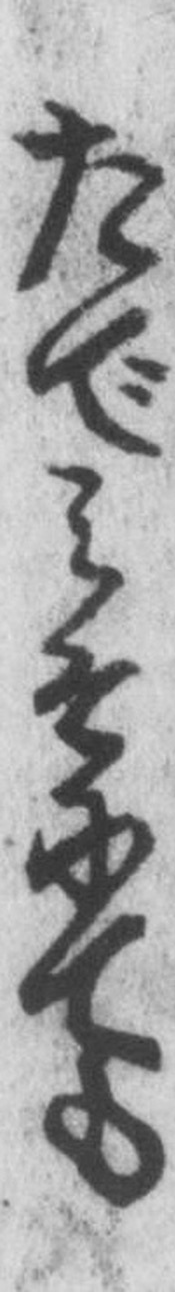たでミそにても
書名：当世料理献立
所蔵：大阪府立大学学術情報センター 国文学研究資料館
